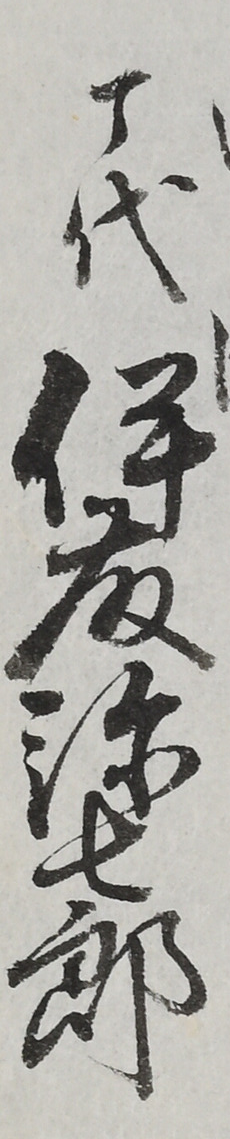丁代伊藤弥七郎
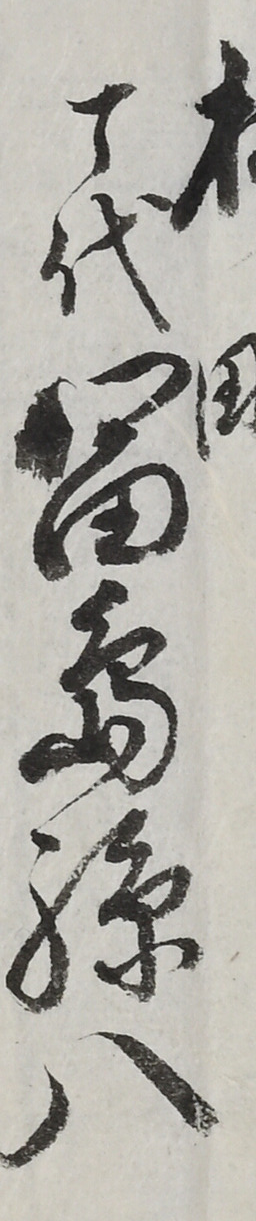丁代冨島孫八
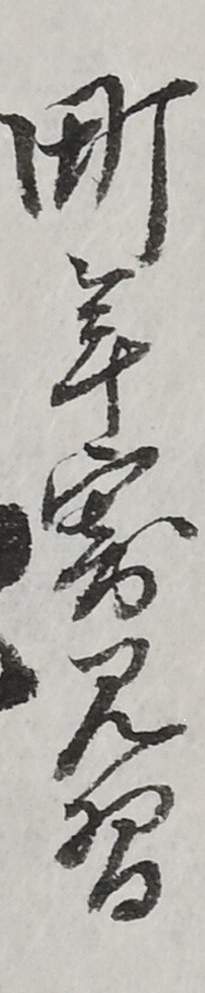町年寄見習
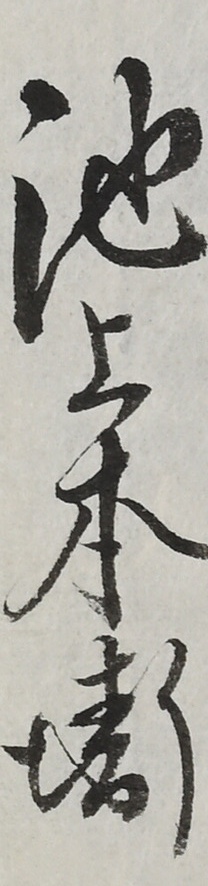池上本衛
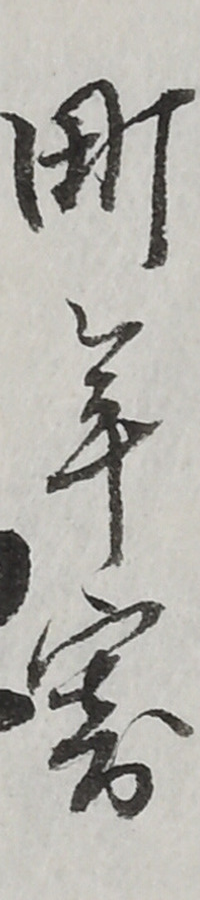町年寄
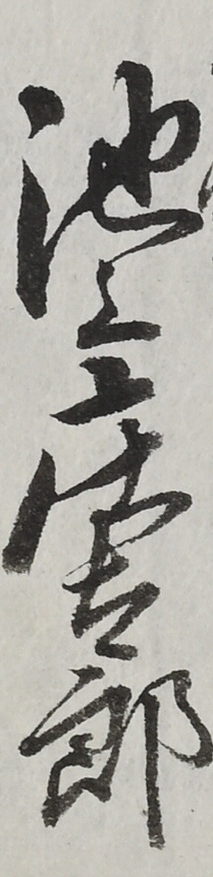池上庄太郎
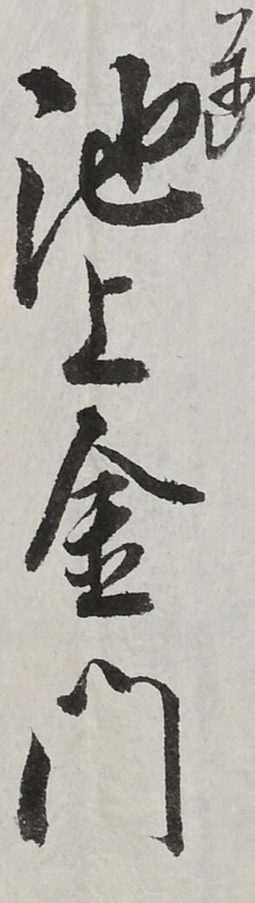池上金門
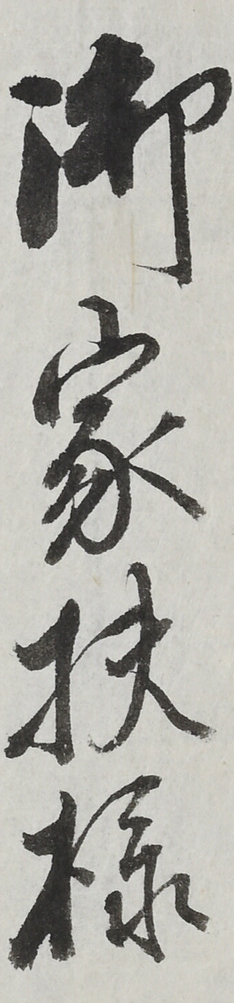御家扶様

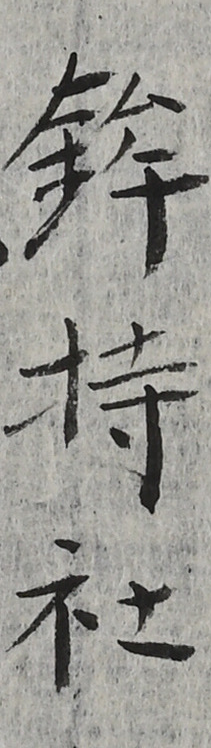鉾持社

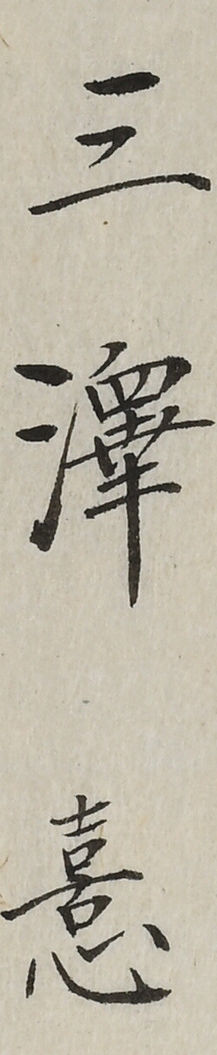三澤憙
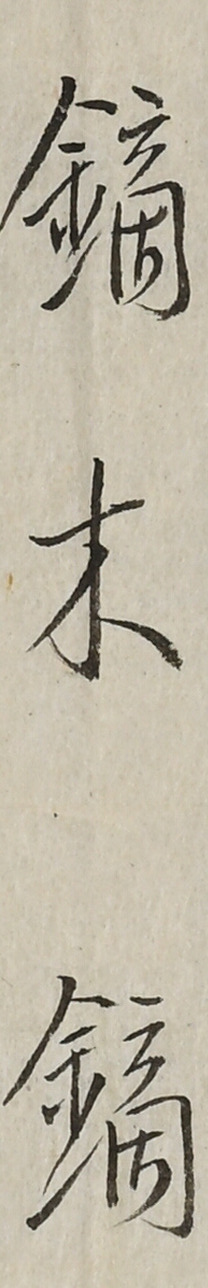鏑木鏑
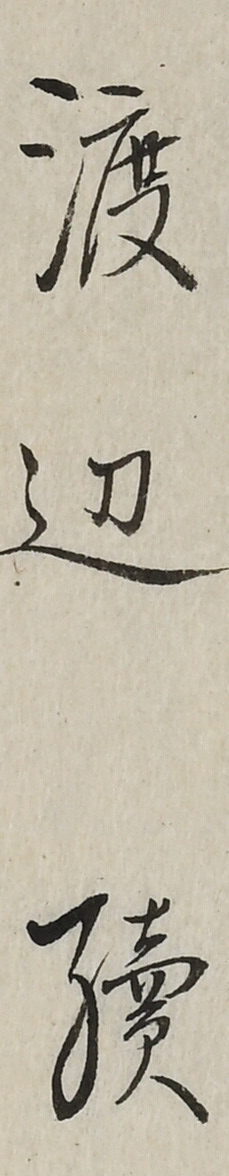渡辺続
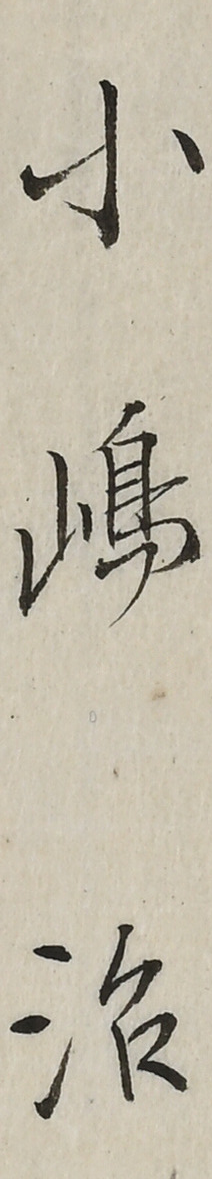小嶋治
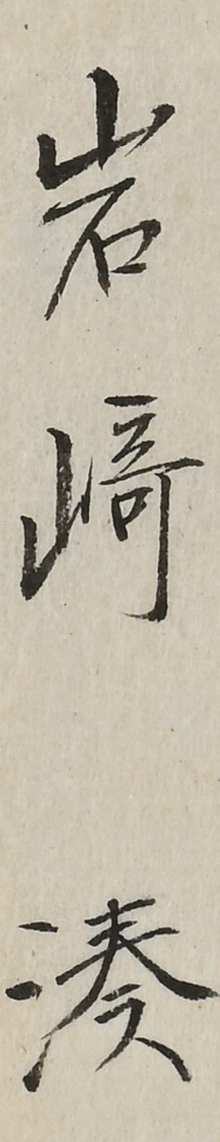岩崎湊
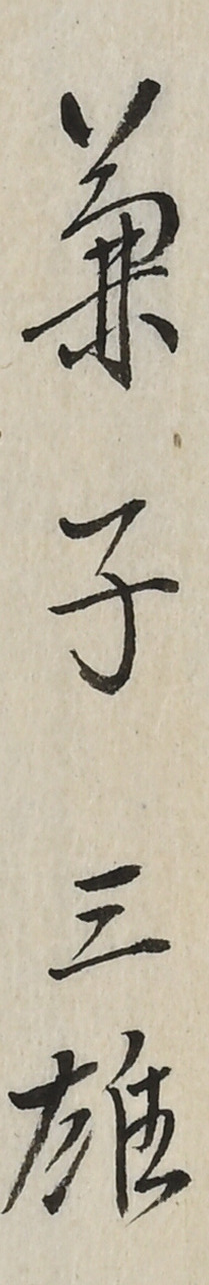兼子三雄
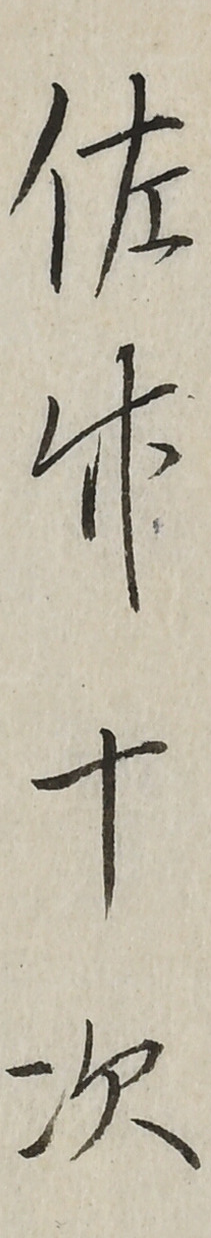佐竹十次
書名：記
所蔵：伊那市立高遠町図書館・合同会社AMANE
